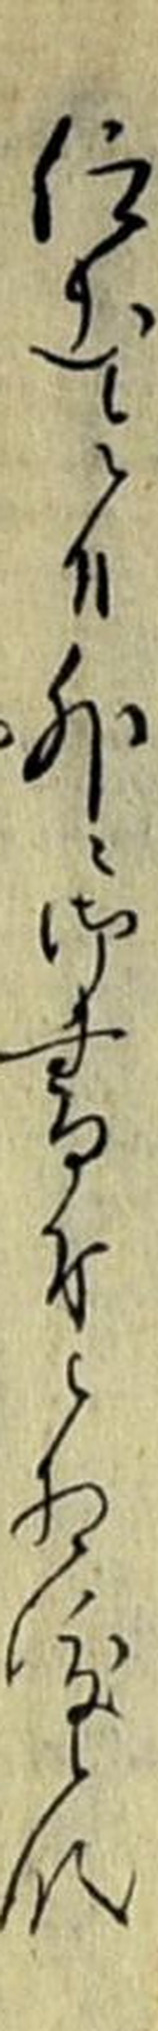仰出候ニ付外ニ御書付可被相渡候段
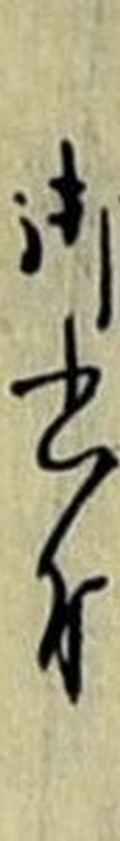御書付
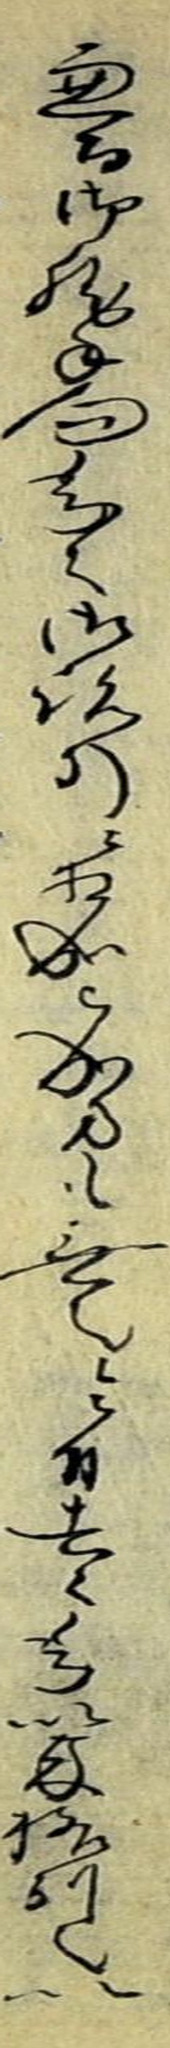兼而御勝手向年々御跡引ニ相成被成方も無之候ニ付去々年以来格別之以
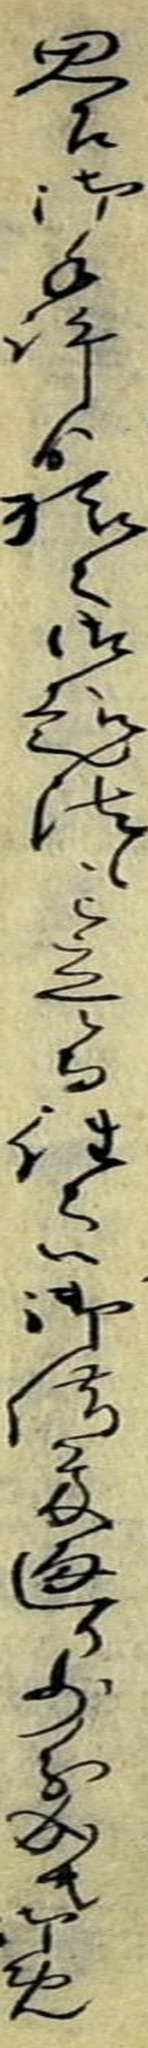思召御手許ゟ様々御趣法も被立候而往々ハ御借米通り少分成共御免
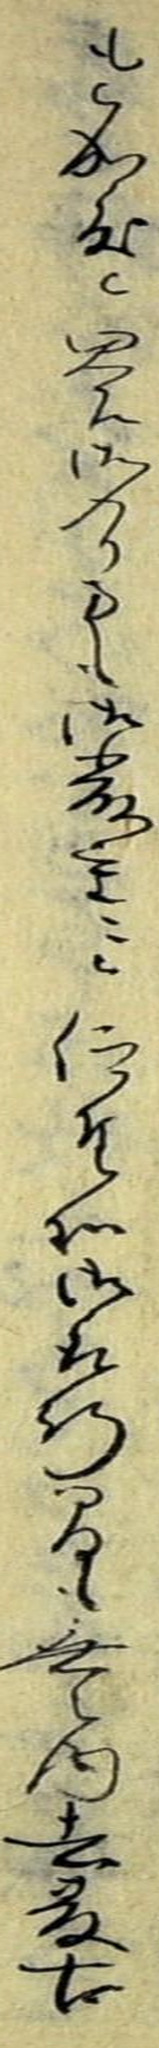も被成度被思召御〆り方も御厳重ニ被仰付候処御取行間も無之内去夏古

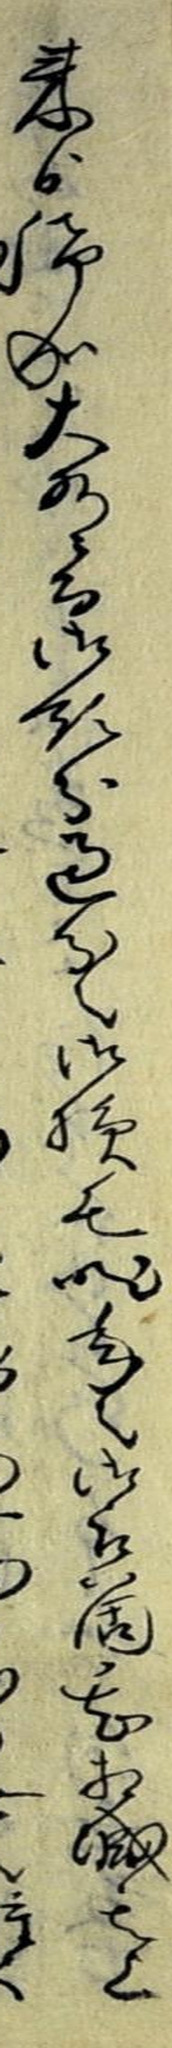来ゟ稀成大水ニ而御領分過分之御損毛昨年之御取箇甚相減其上
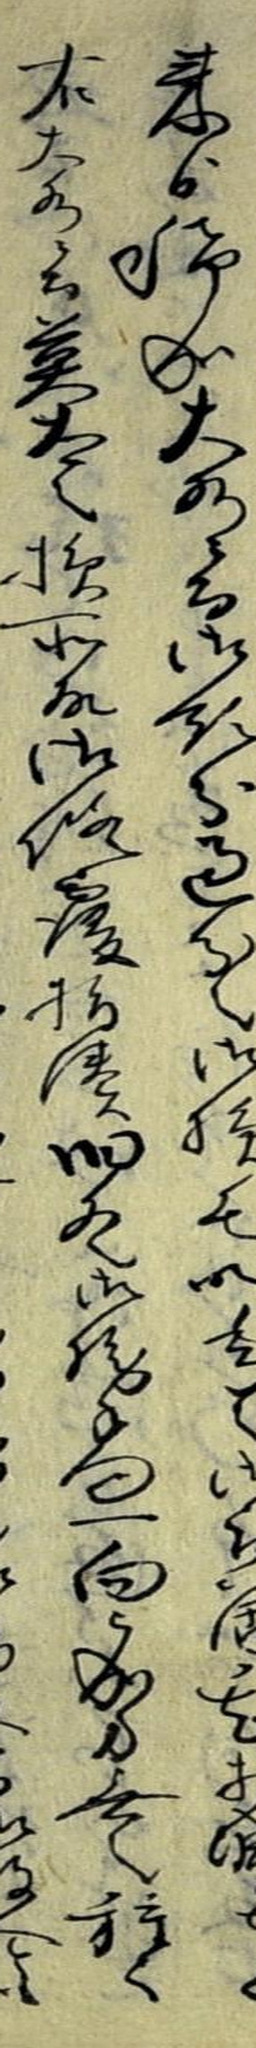右大水ニ而莫太之損所故御修覆指湊旧冬御勝手向一向ニ成方無之種々
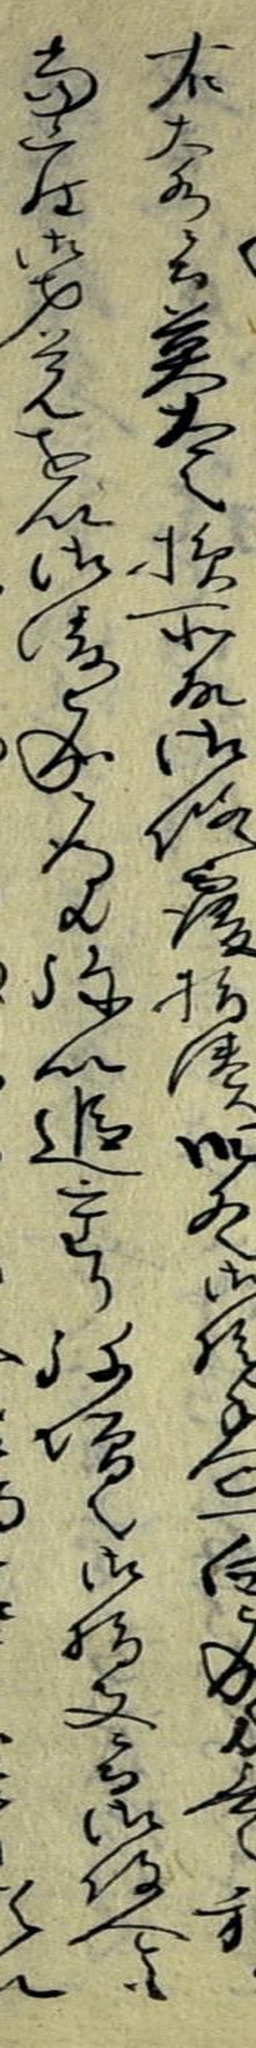当座御才覚を以御凌被成候得共弥以追重り弥増之御指支ニ而御役人とも
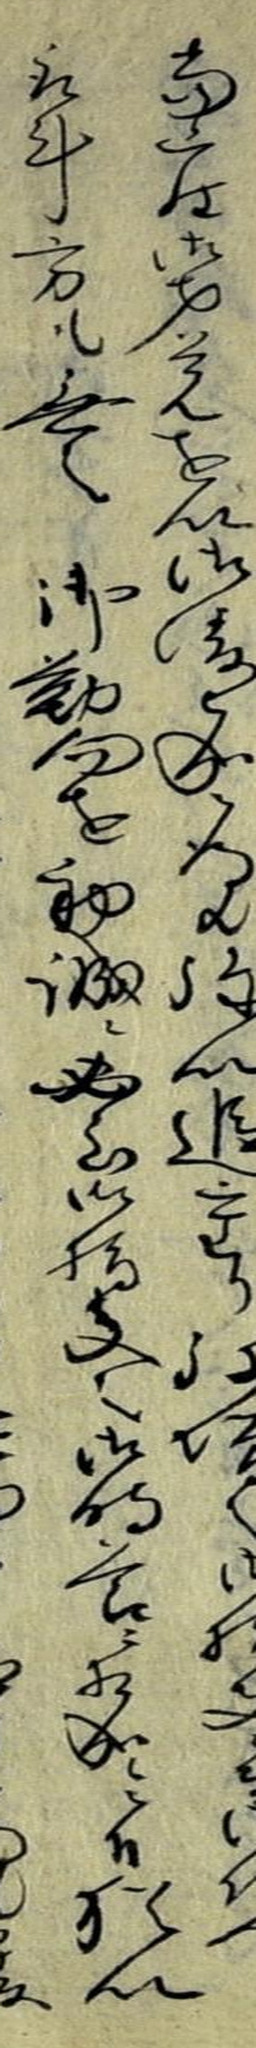取計方も無之御勤向を初誠ニ必至御指支之御時節ニ相成候ニ付猶以
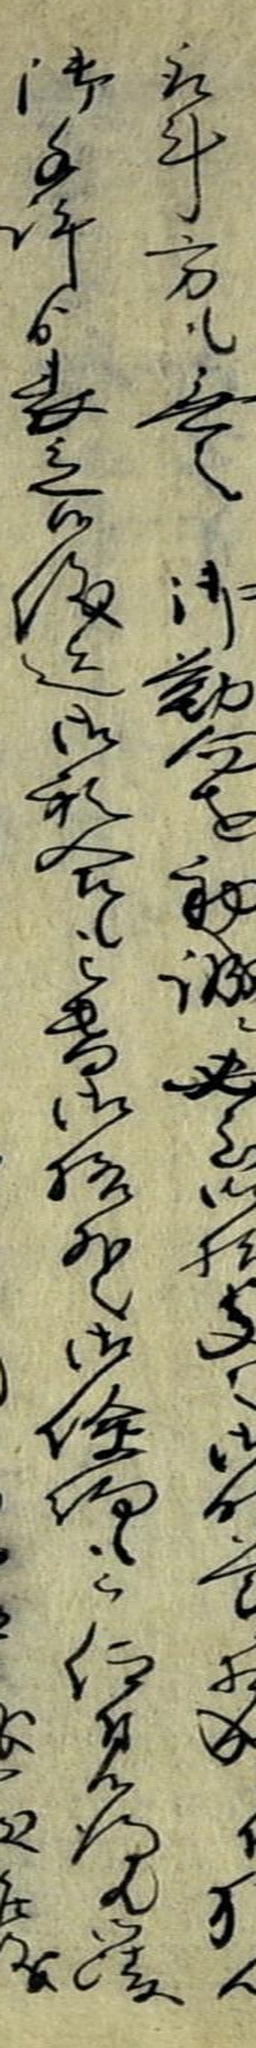御手許ゟ表立候儀迄御形合も被替御格外之御倹約も被仰付候得共御凌
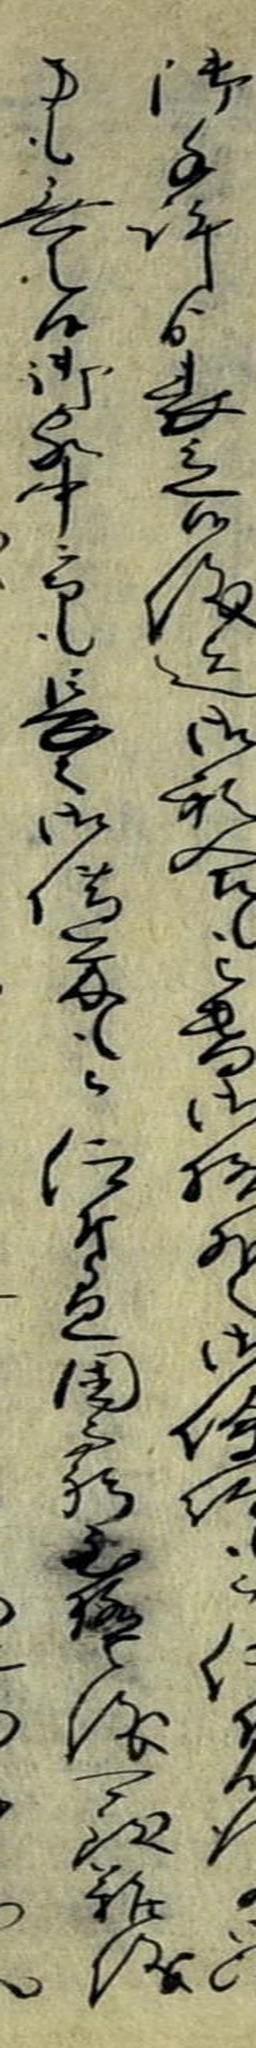方も無之候御家中ニ而も長々御借米も被仰付置困窮至極之儀可致難儀
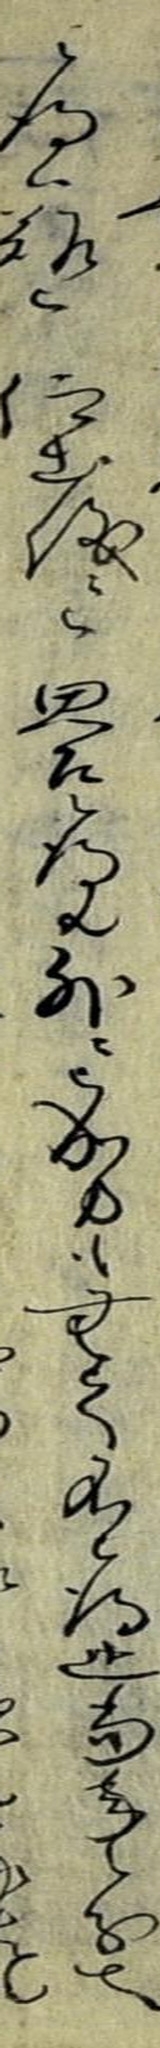候得ハ難被仰出儀ニ被思召候得共外ニ被成方も無之不被得止当年之分者
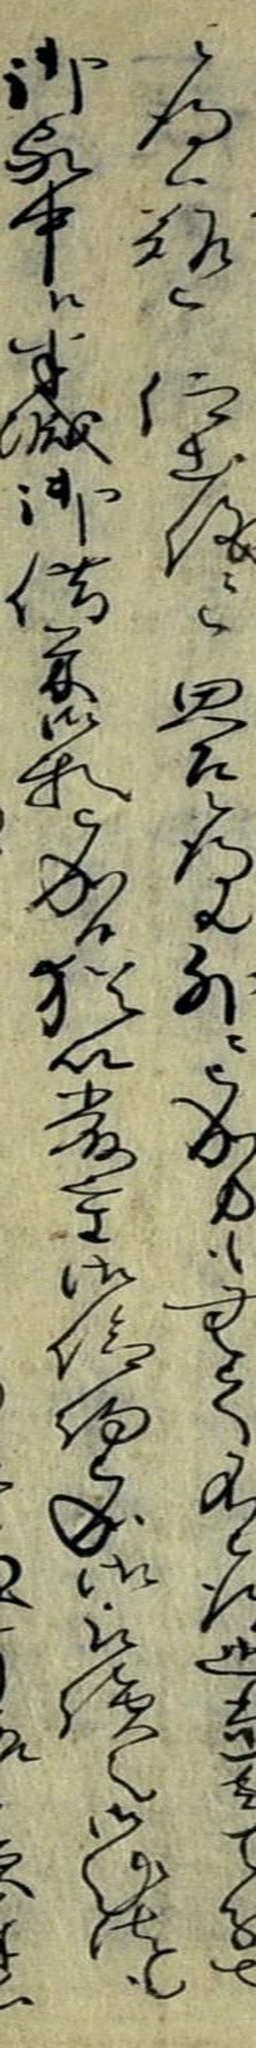御家中江半減御借米御頼被成候猶以厳重御倹約被成御取続之御趣法も
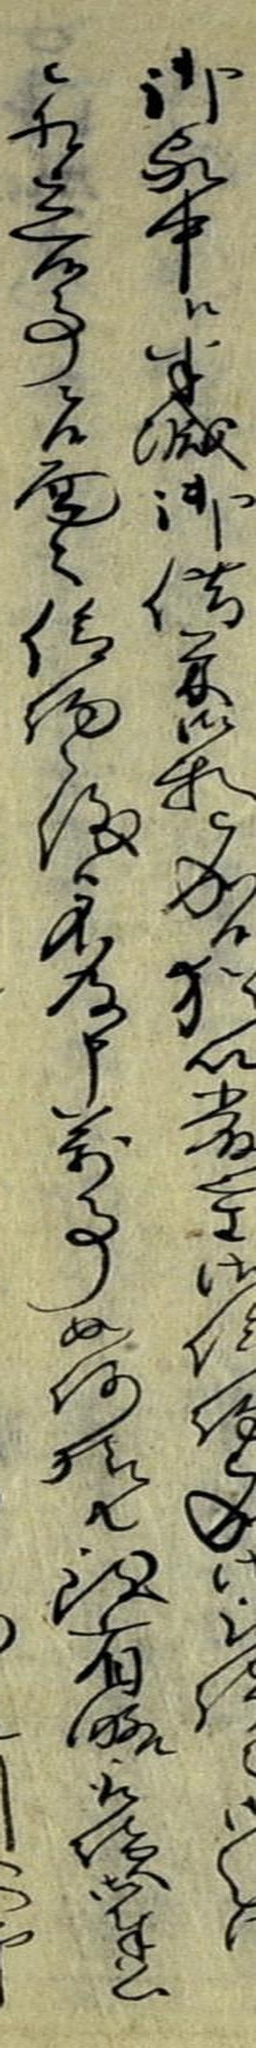被相立候事ニ候面々倹約之儀ハ不及申万事如何様共致省略取続御奉公
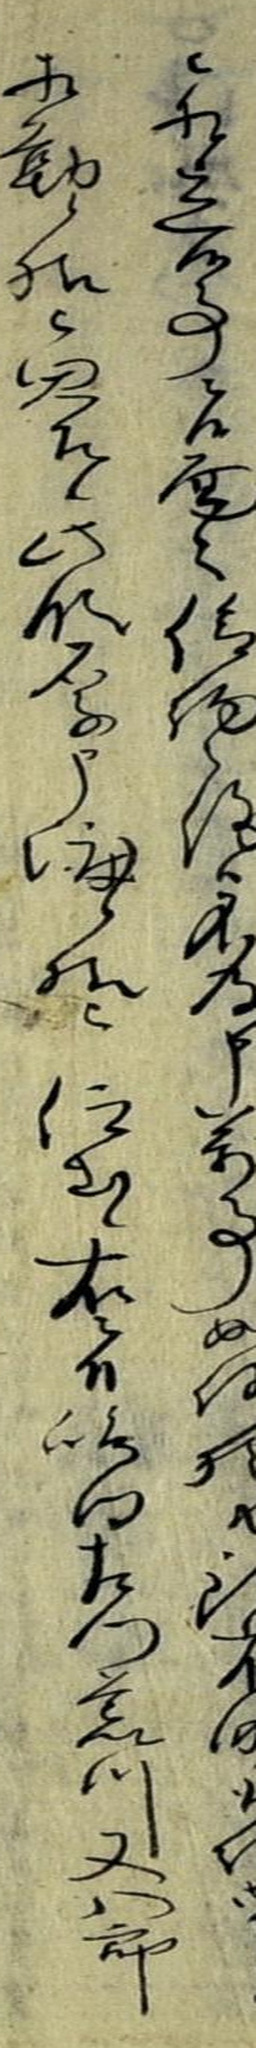相勤候様被思召候此段厚申渡候様被仰出候右ニ付嶋田左門荒川又八郎
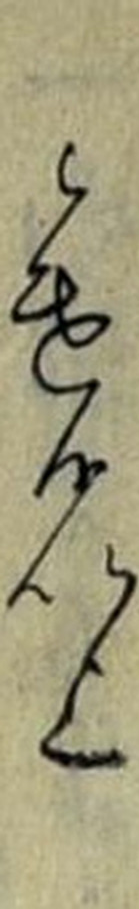被遣候以上
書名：命令之部 三
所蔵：福井県文書館 Fukui Prefectural Archives
